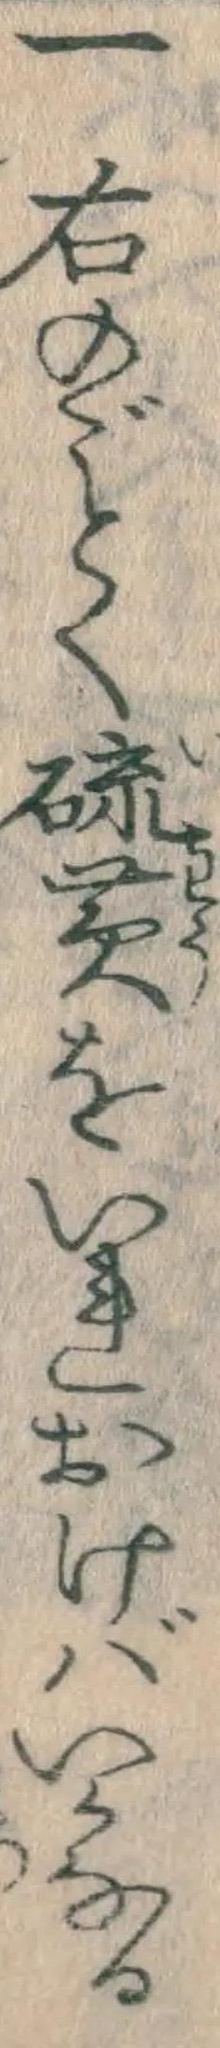一右のごとく硫黄をいれおけばいかなる
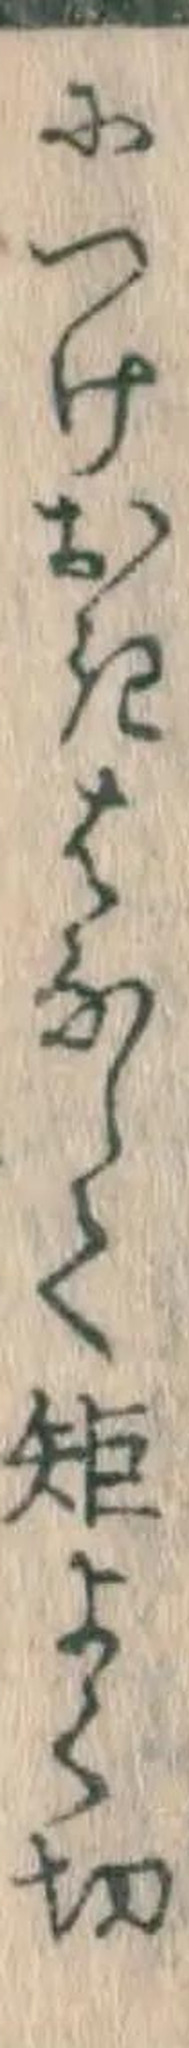につけおきはなして矩よく切
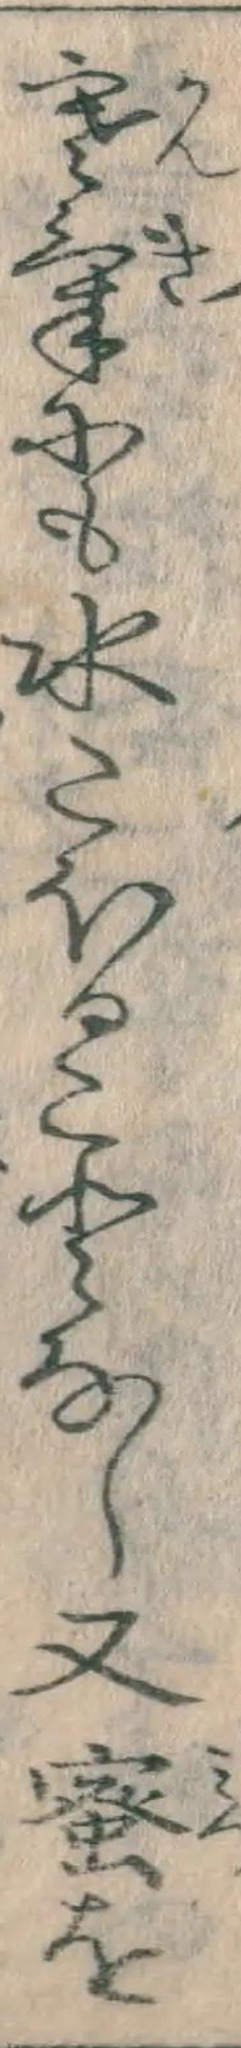寒気にも水こほることなし又蜜を
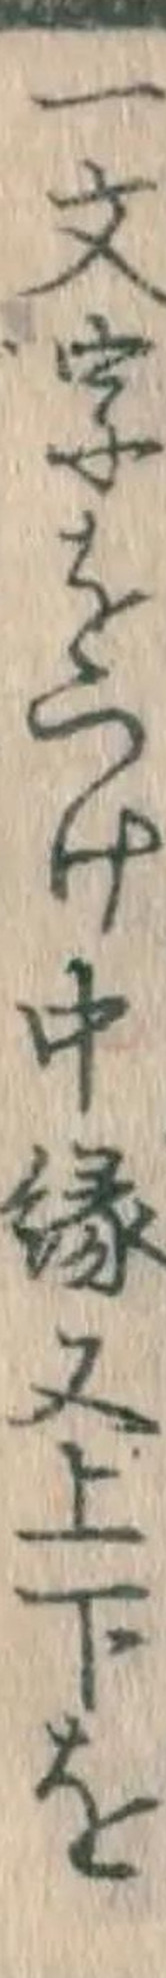一文字をつけ中縁又上下を
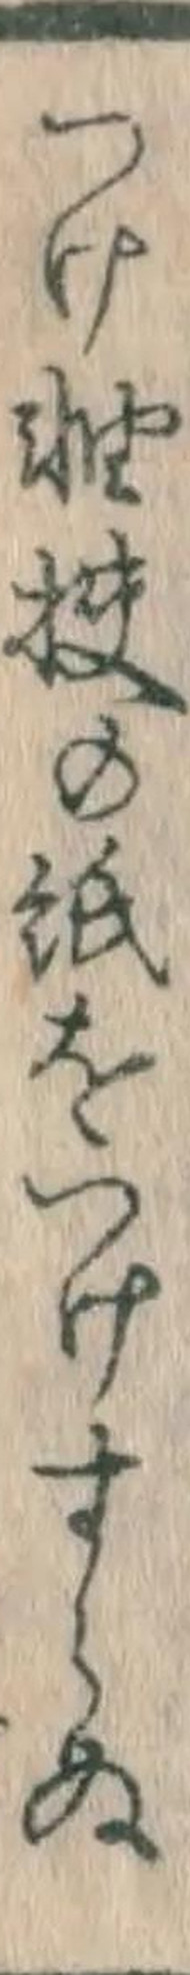つけ軸挟の紙をつけすらぬ
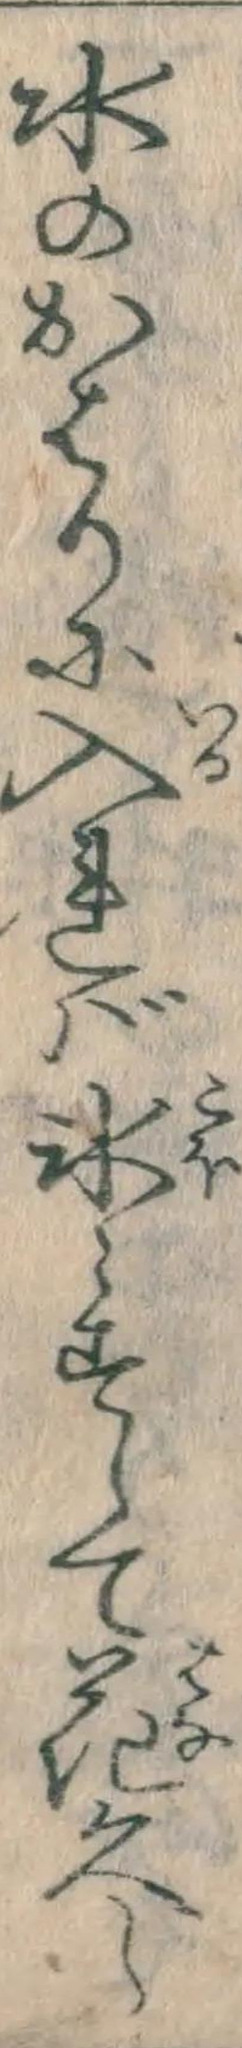水のかはりに入れば氷らすして花久し
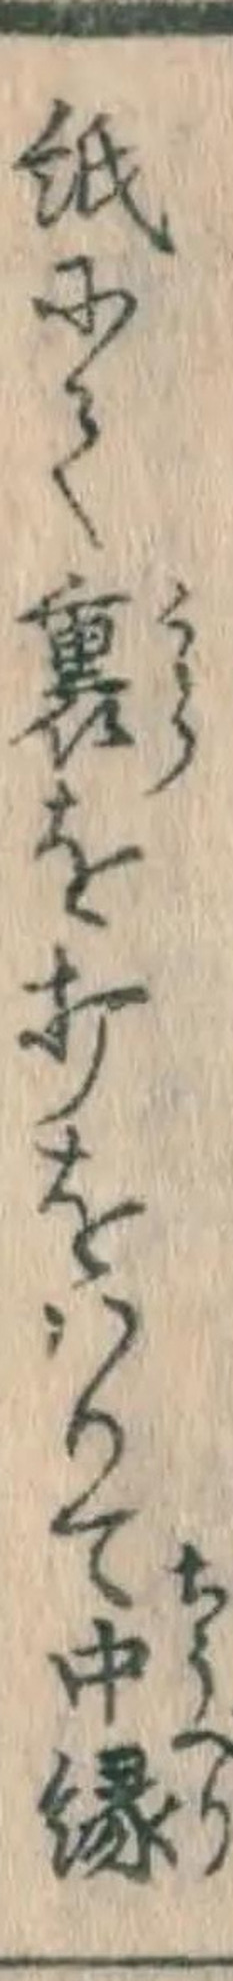紙にて裏を打をはりて中縁
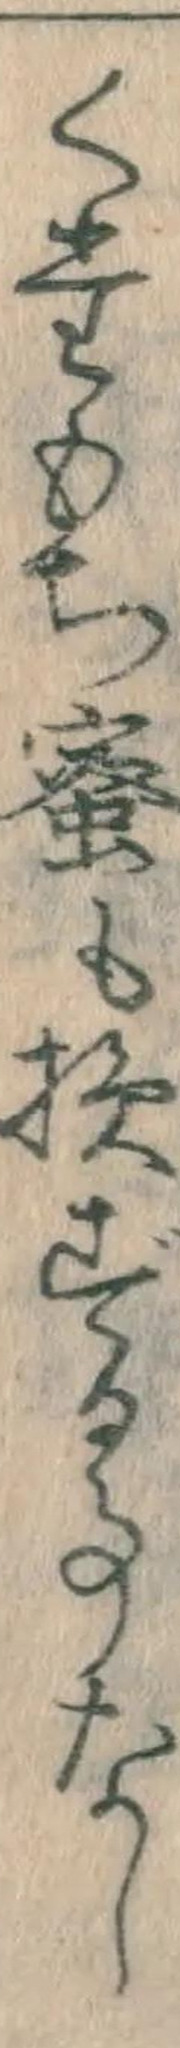くたもち蜜も損ずる事なし

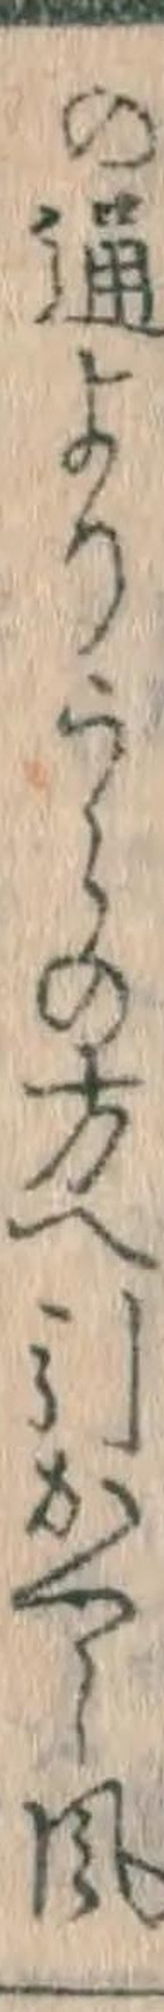の通よりうらの方へ引かへし風
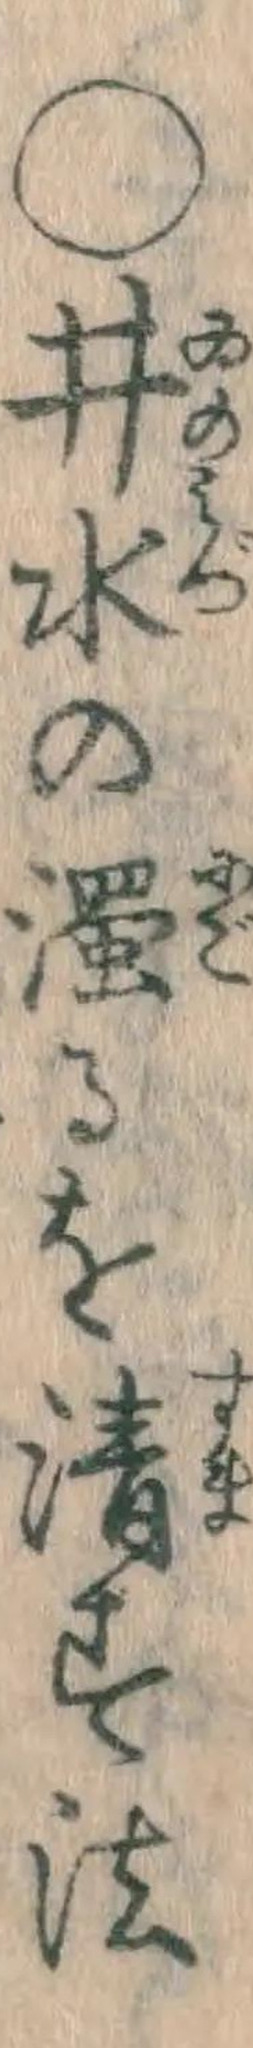○井水の濁るを清す法
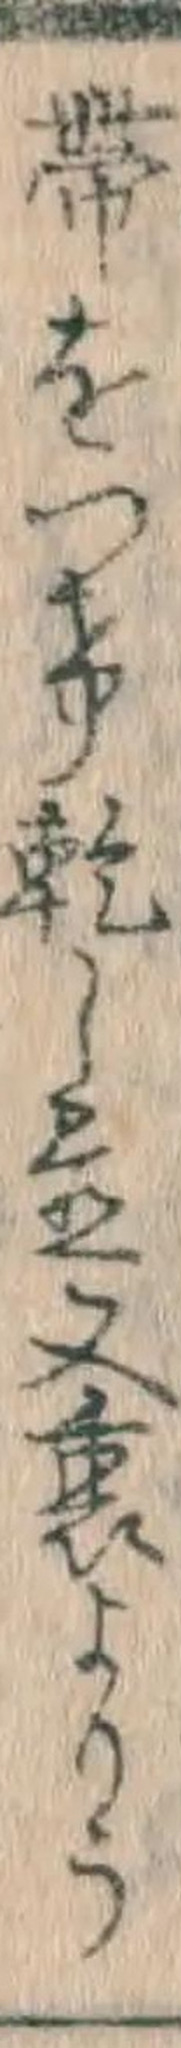帯をつけ乾し置又裏よりう
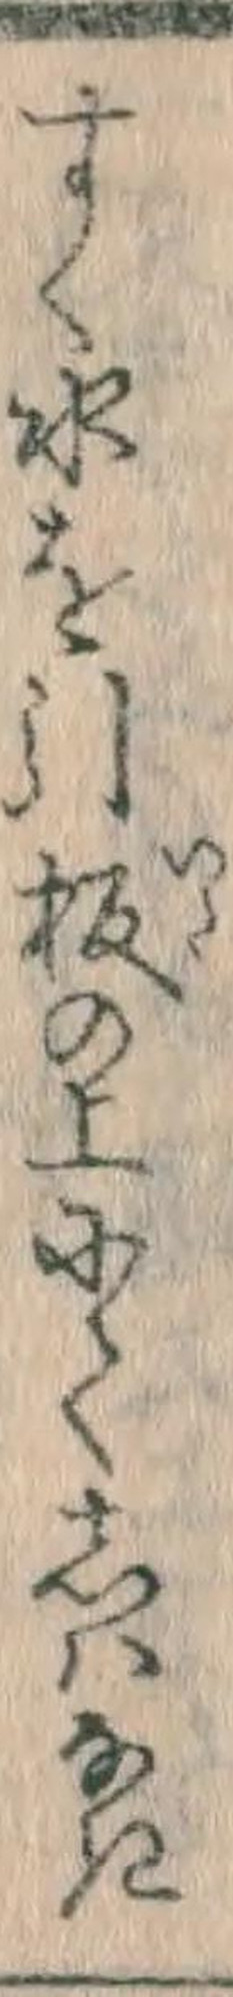すく水を引板の上にてしはなき
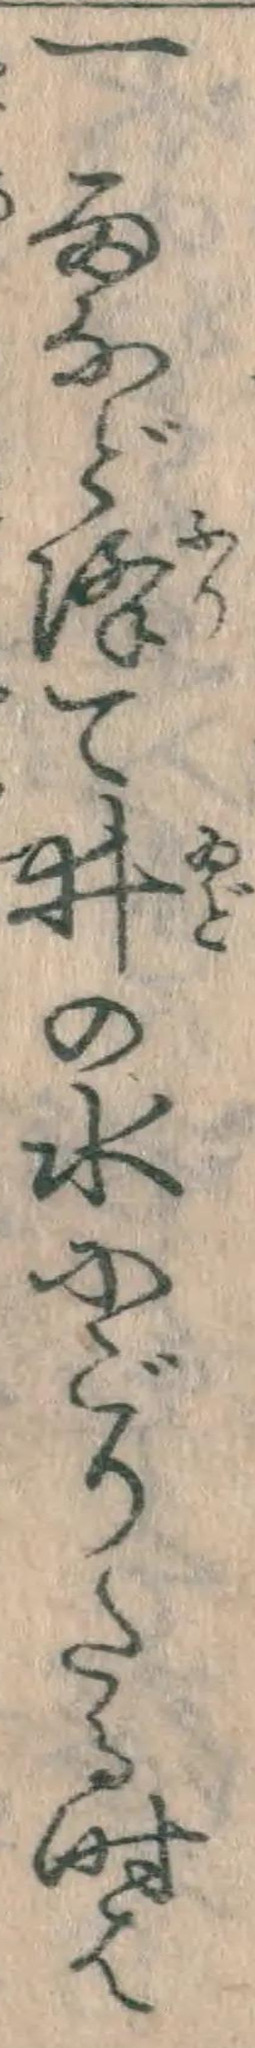一雨など降て井の水にごりたる時は
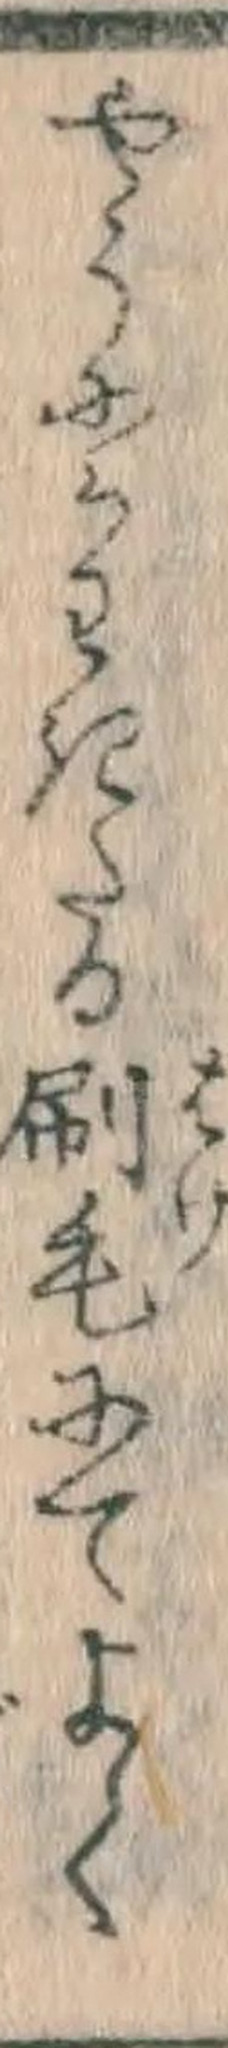やうにかわきたる刷毛にてよく
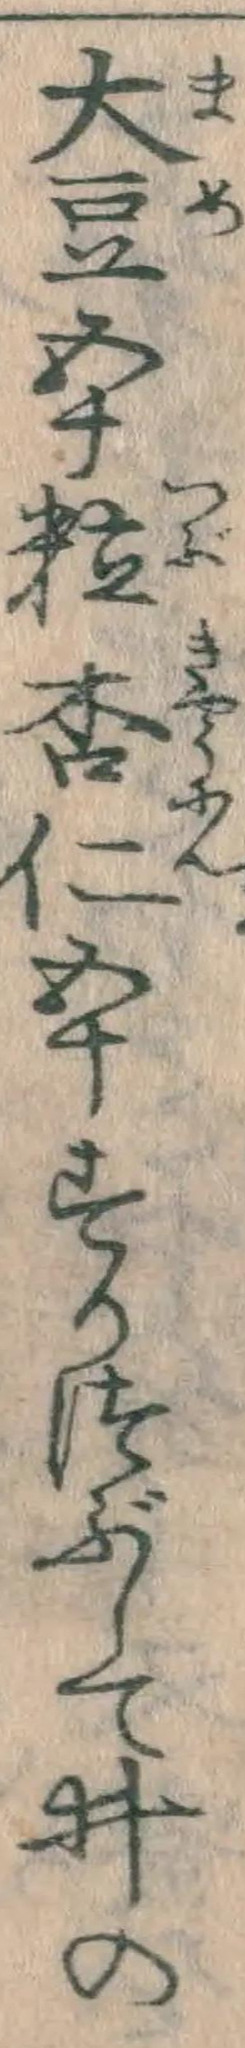大豆五十粒杏仁五十すりつぶして井の
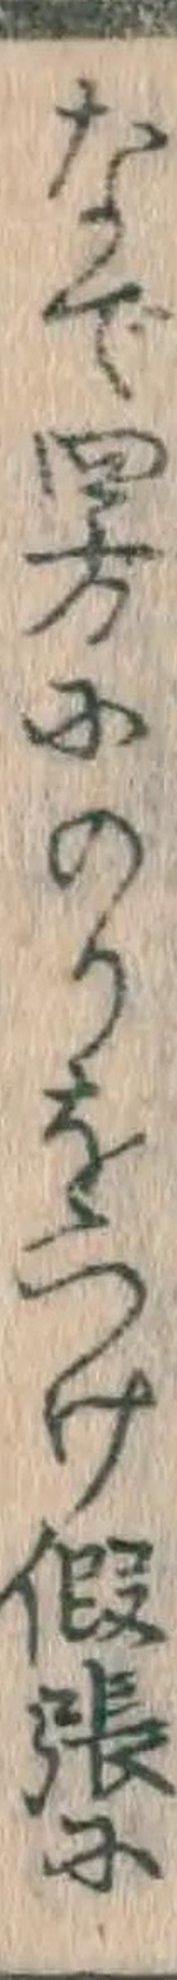なで四方にのりをつけ假張に
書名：広益秘事大全 3巻. [2]
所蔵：国立国会図書館 National Diet Library, JAPAN
